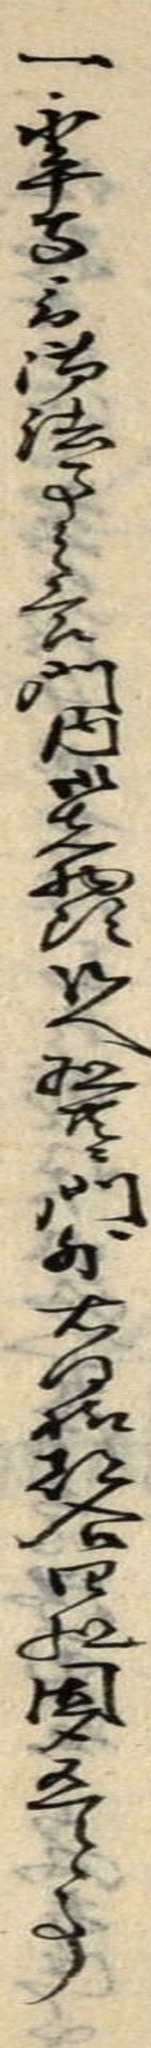一永平寺に而御法事之節門内御先物頭弐人組共に門外右同様都合四組固め有之候事
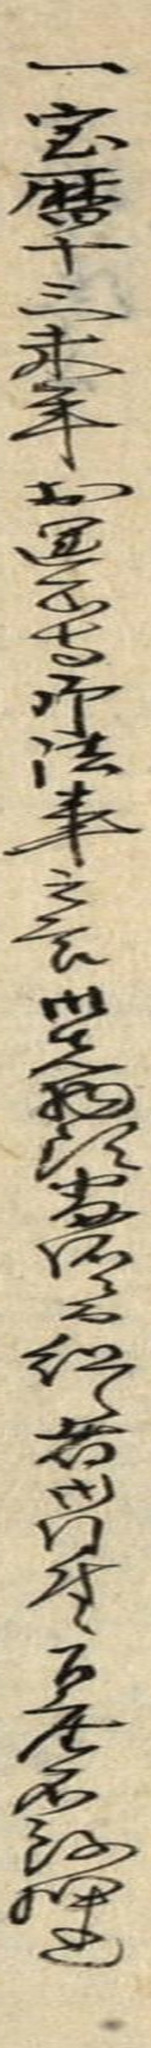一宝暦十三未年於運正寺御法事之節御先物頭番所に而組之者御目付へ下座不致押込
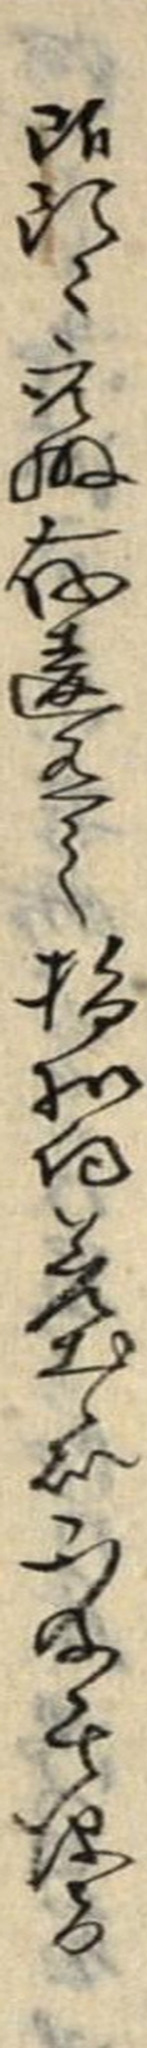附頭々取扱存違有之指扣伺差出候処不及其儀旨

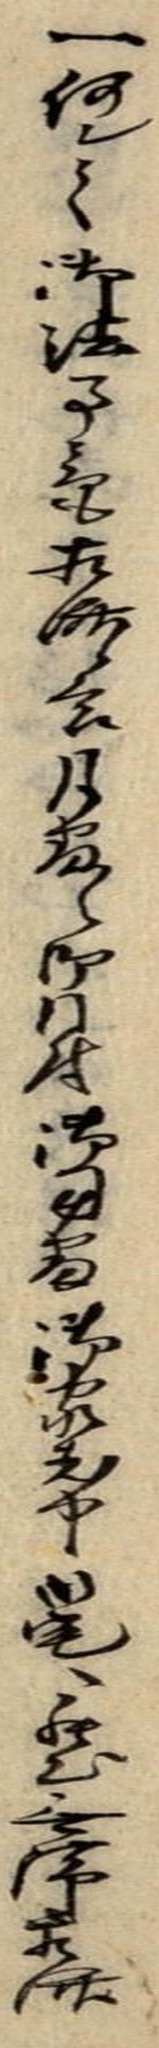一何れ之御法事に而も相済候節月番之御目付御用番御家老中御宅へ罷出無滞相済
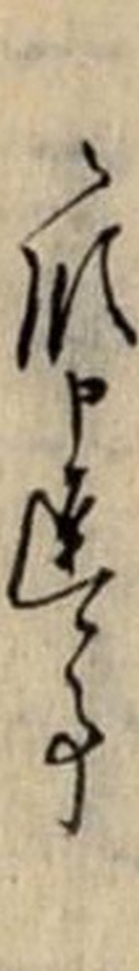候段申達候事
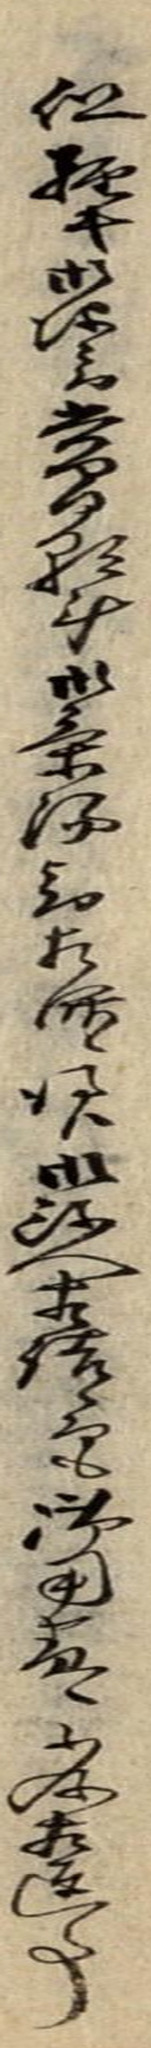但軽き御儀に而当日朝斗御茶湯に而相済候得は御役人相詰候而も御用番へ不及相達事
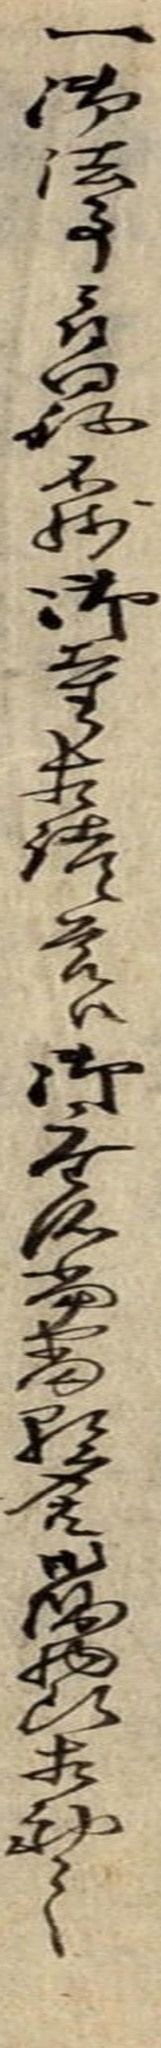一御法事に付同役不残御寺へ相詰候節は御座所当番朝夕共御側物頭相勤之
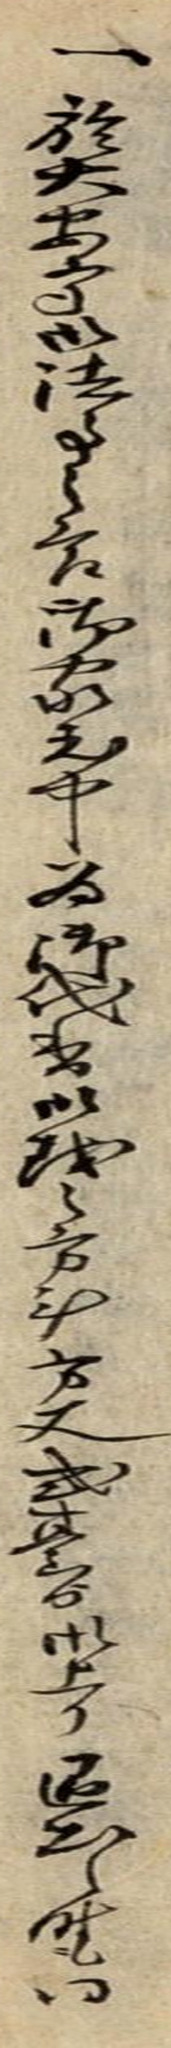一於大安寺御法事之節御家老中為御代香御越之方斗方丈式台ゟ御上り退出之時も同
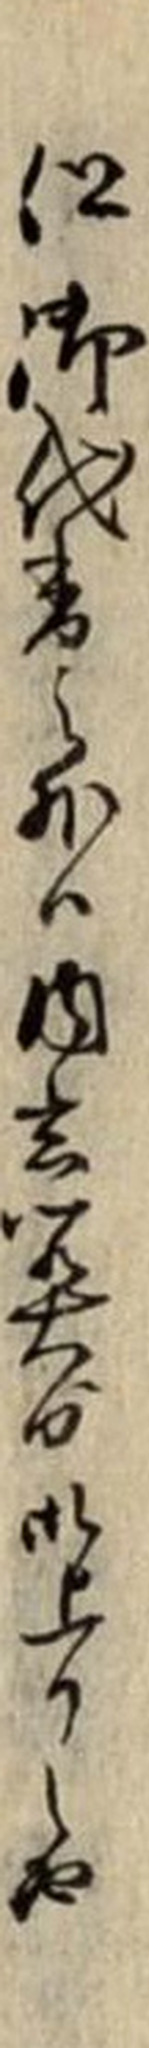但御代香之外は内玄関ゟ御上り之由
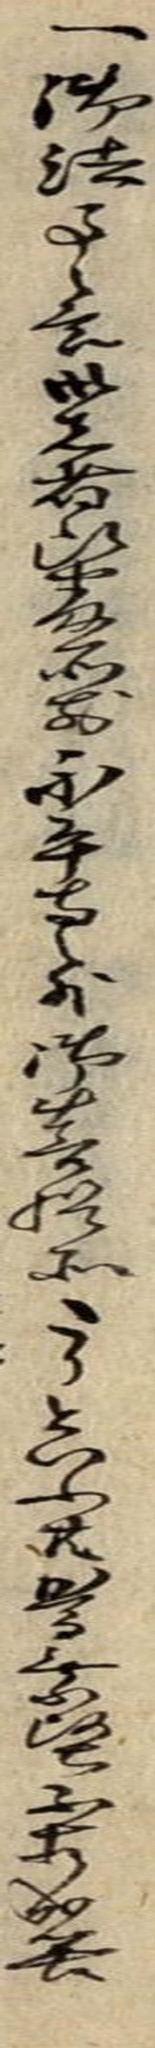一御法事之節御先者頭番所前永平寺之外御菩提所たりといふ共駕乗堅不相成筈
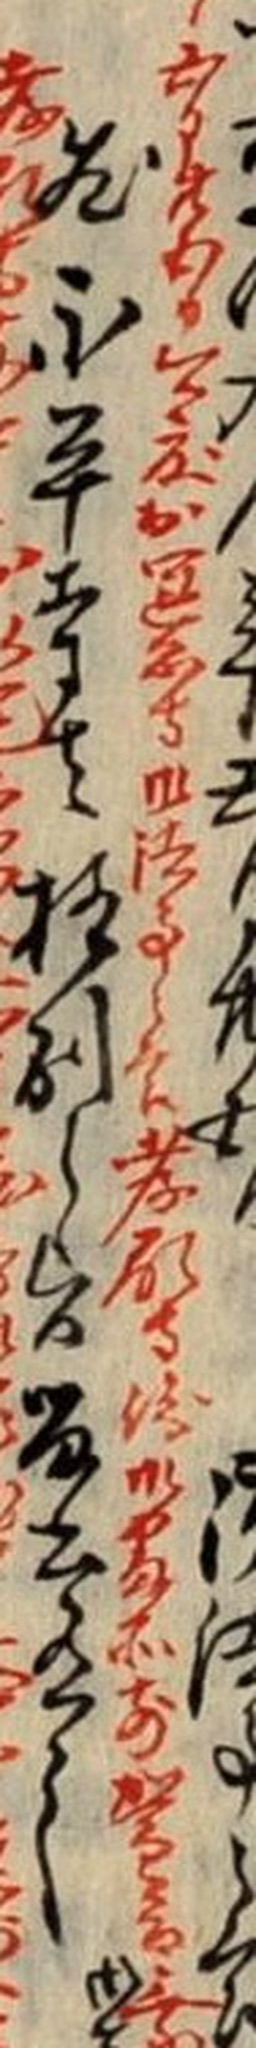敷永平寺は格別之旨留書有之
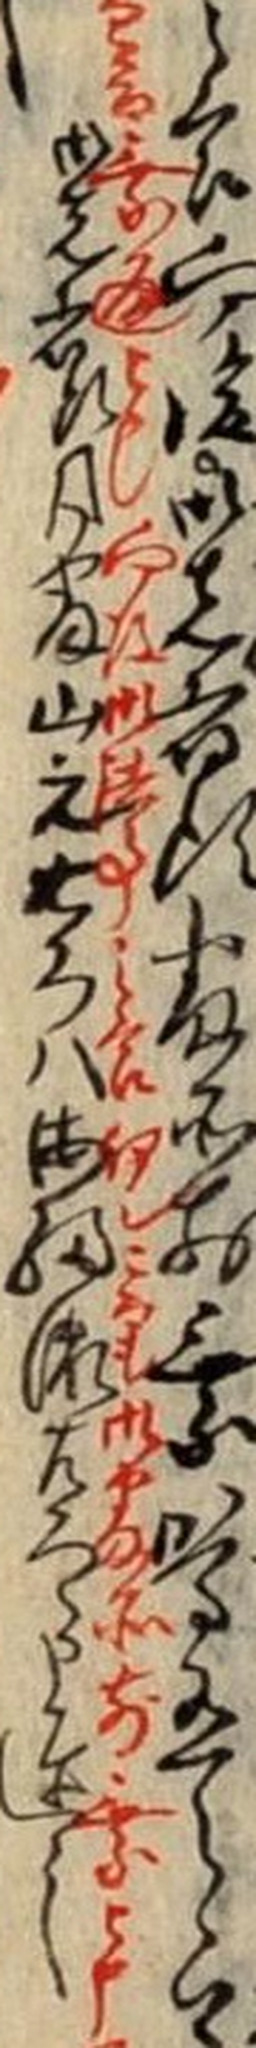御先者頭月番山元右衛門八海福瀬左衛門へ申達之
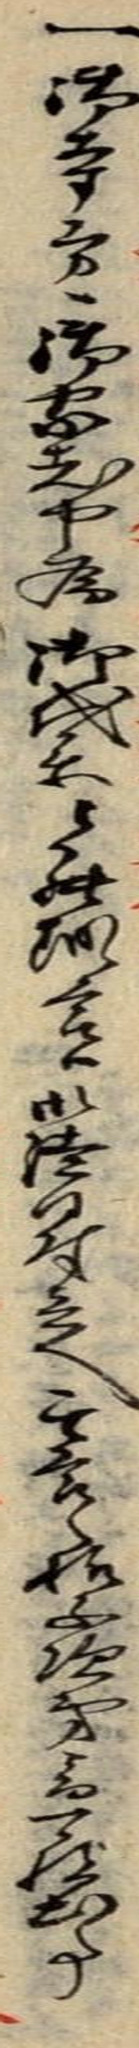一御寺方へ御家老中為御代香に被罷越候節は御徒目付壱人其節之様子次第に而可罷出事
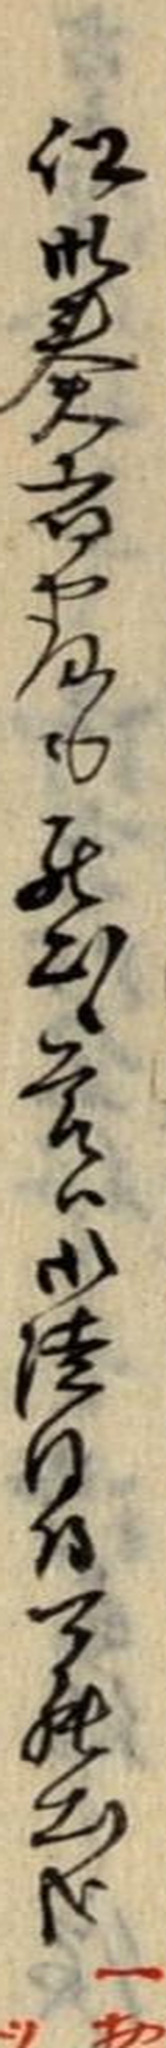但御奏者番も罷出候節は御徒目付可罷出哉
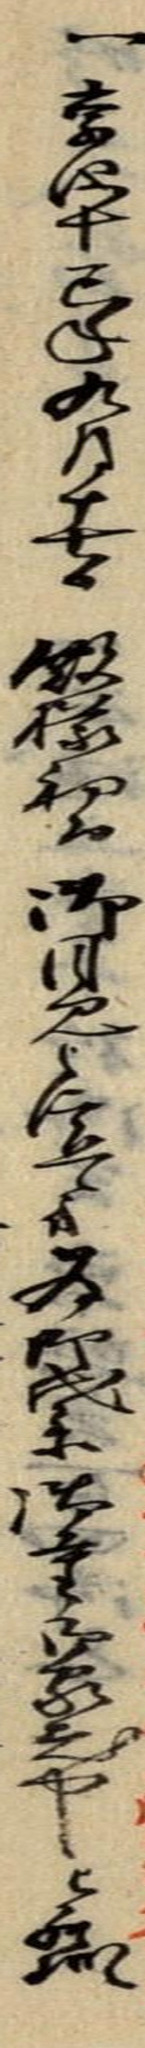一享保十巳年九月十七日殿様初而御目見被仰上候に付為御代参御寺に御家老中被罷越候
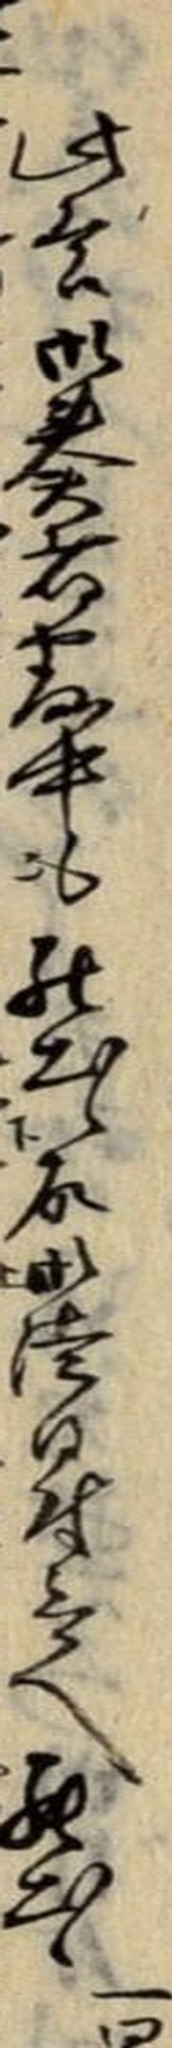此節御奏者番中も罷出候故御徒目付壱人罷出候
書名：蒐輯之部
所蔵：福井県文書館 Fukui Prefectural Archives
